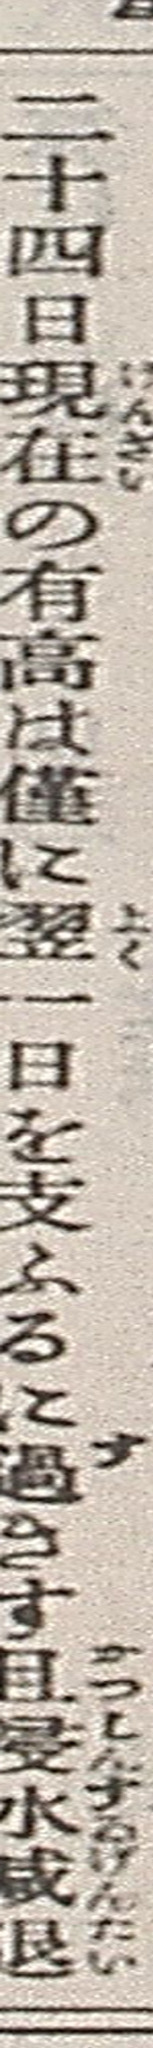二十四日現在の有高は僅に翌一日を支ふるに過ぎす且浸水減退
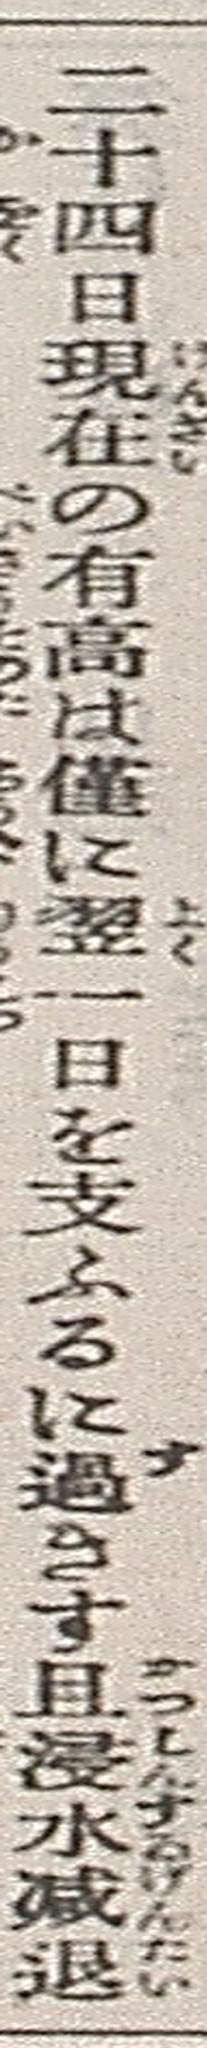二十四日現在の有高は僅に翌一日を支ふるに過ぎす且浸水減退
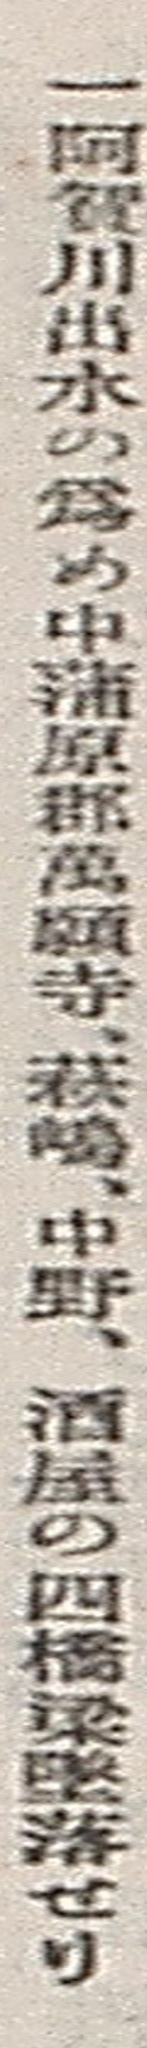一阿賀川出水の為め中蒲原郡万願寺、萩嶋、中野、酒屋の四橋梁墜落せり
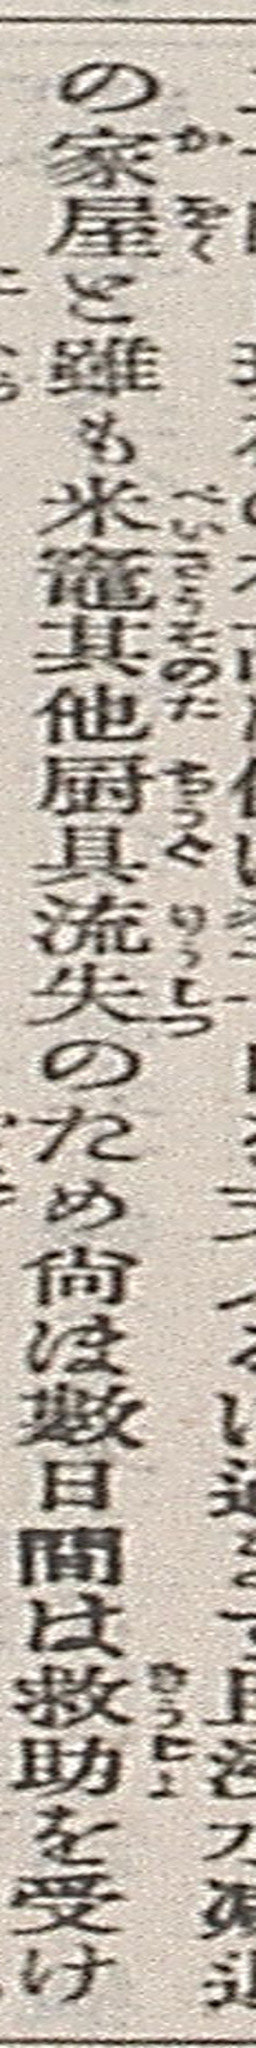の家屋と雖も米竈其他厨具流失のため尚ほ数日間は救助を受け
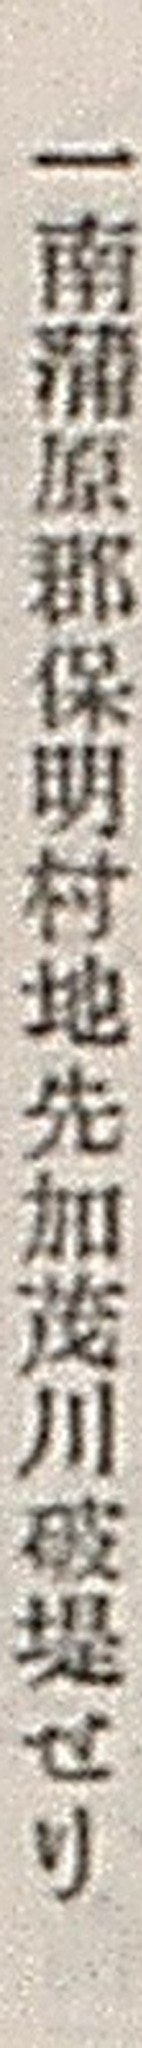一南蒲原郡保名村地先加茂川破堤せり
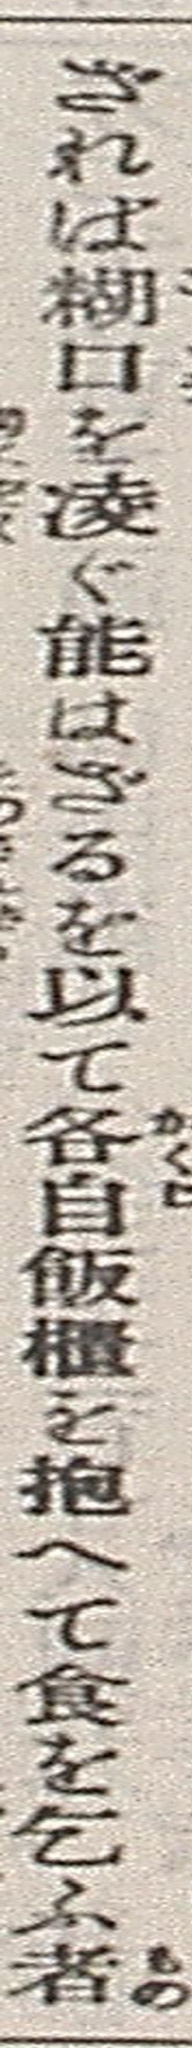ざれば糊口を凌ぐ能はざるを以て各自飯櫃を抱へて食を乞ふ者
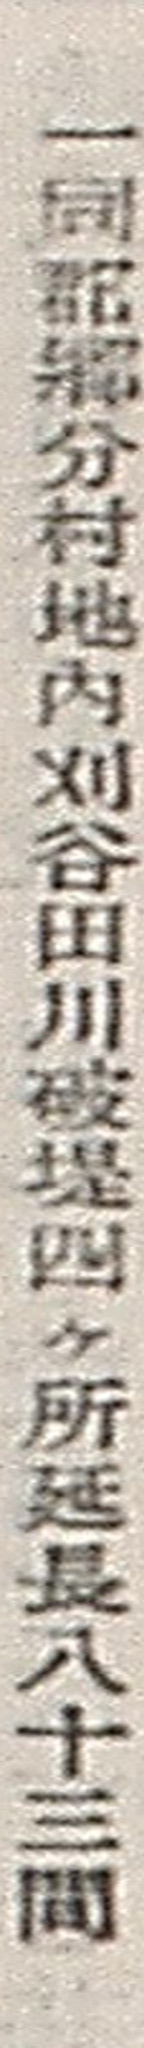一同郡郷分村地内刈谷田川破堤四ヶ所延長八十三間
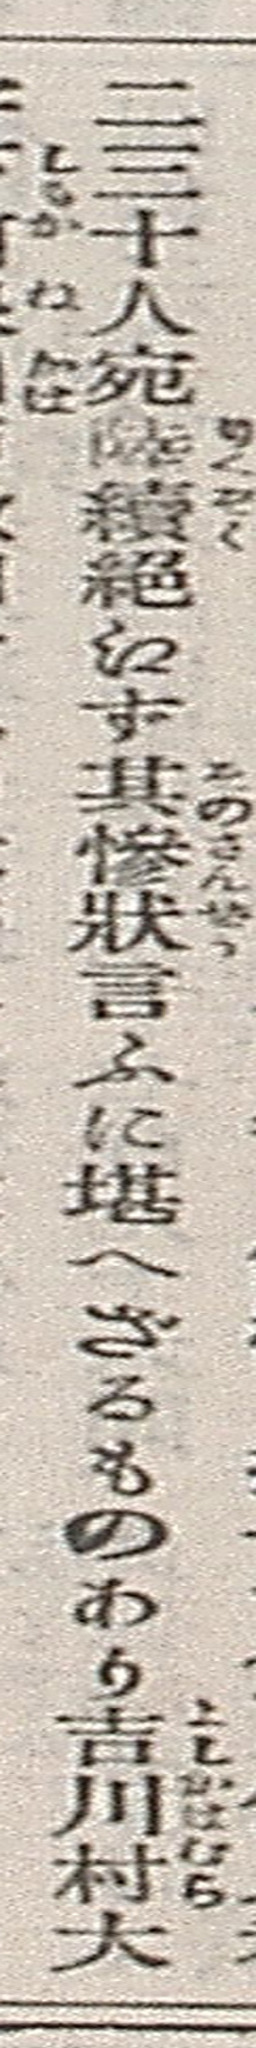二三十人宛陸続絶えず其惨状言ふに堪へざるものあり吉川村大
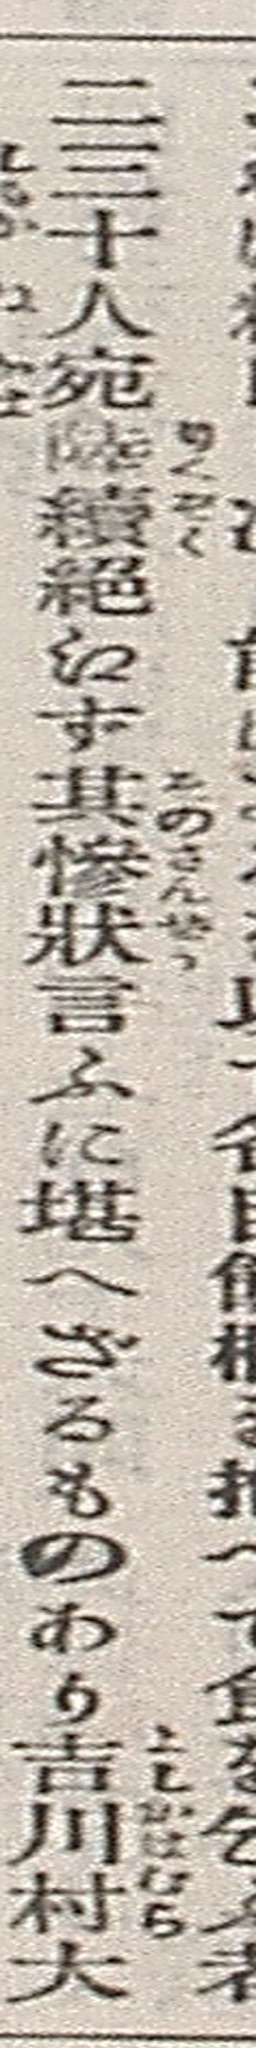二三十人宛陸続絶えず其惨状言ふに堪へざるものあり吉川村大
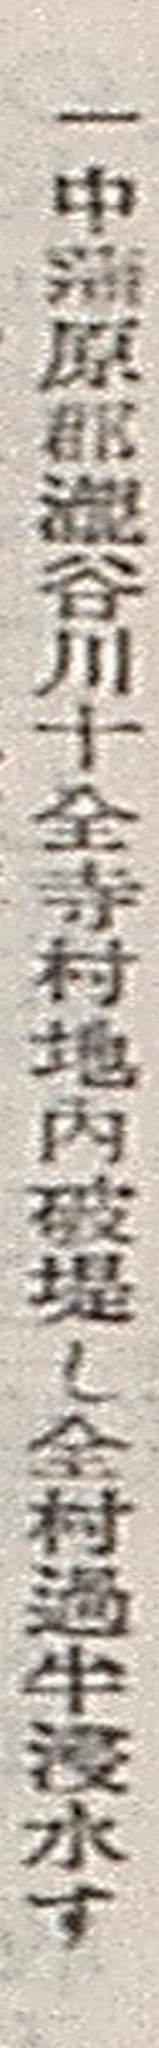一中蒲原郡瀧谷川十全寺地内破堤し全村過半浸水す
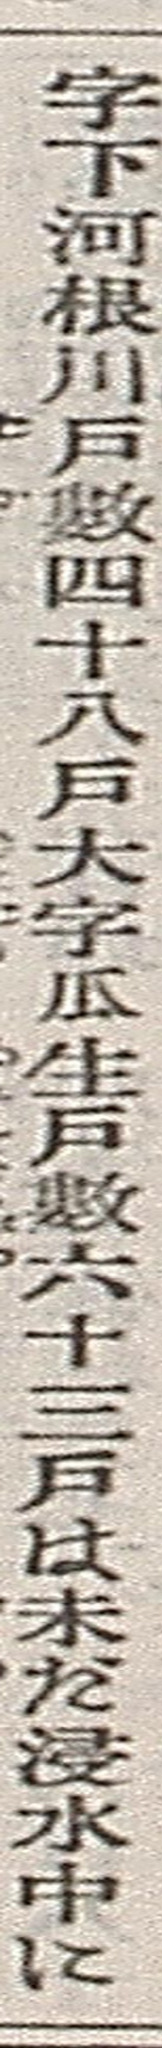字下河根川戸数四十八戸大字瓜生戸数六十三戸は未だ浸水中に
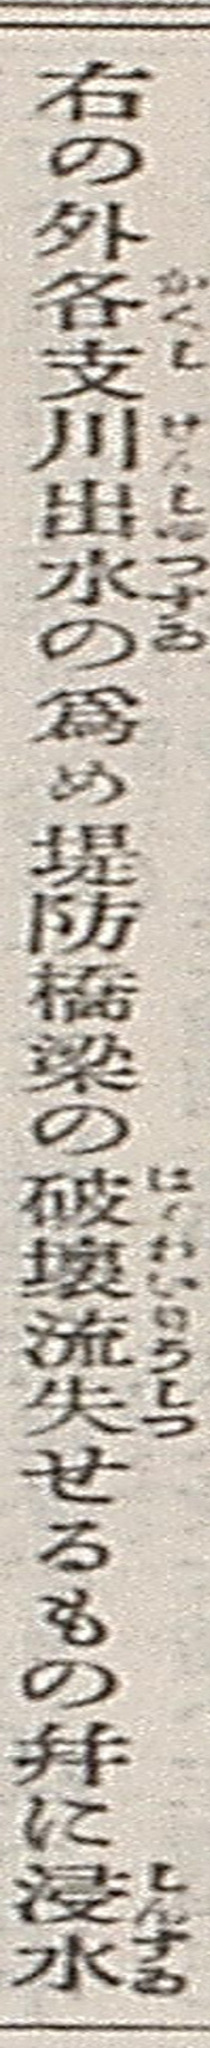右の外各支川出水の為め堤防橋梁の破壊流失せるもの并に浸水
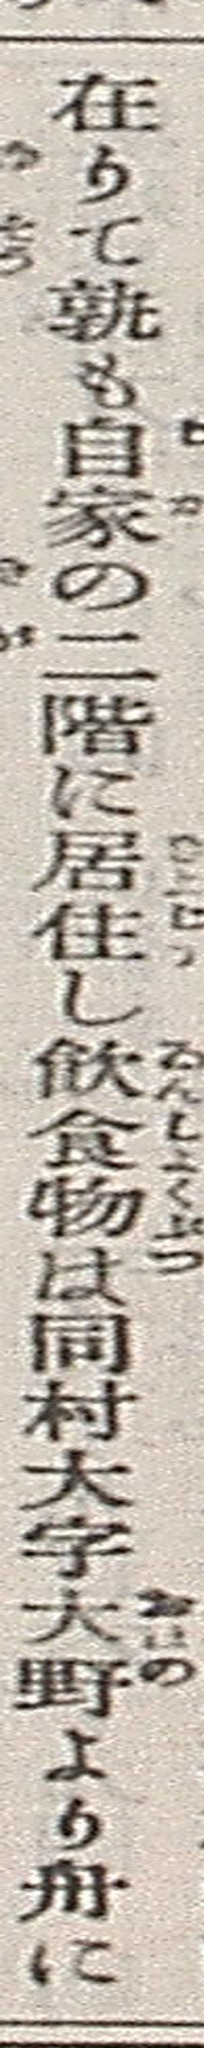在りて孰も自家の二階に居住し飲食物は同村大字大野より舟に
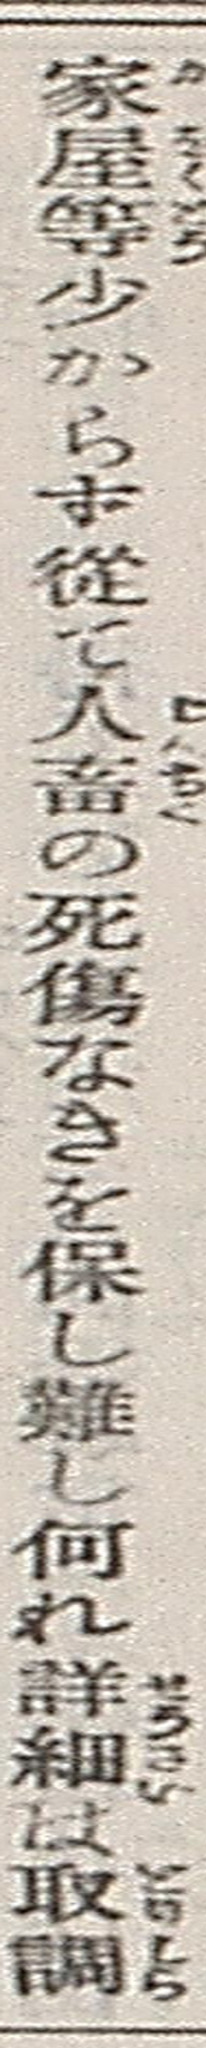家屋等少からず従て人畜の死傷なきを保し難し何れ詳細は取調
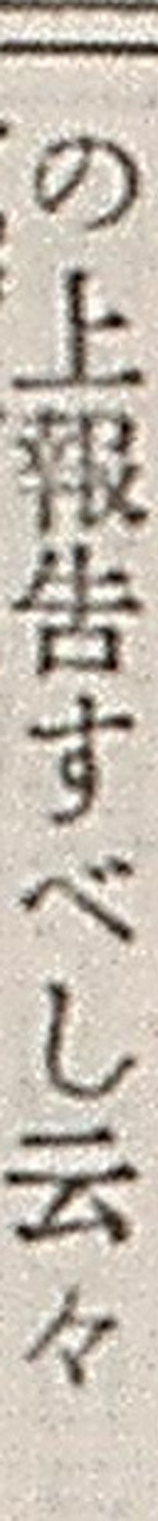の上報告すべし云々
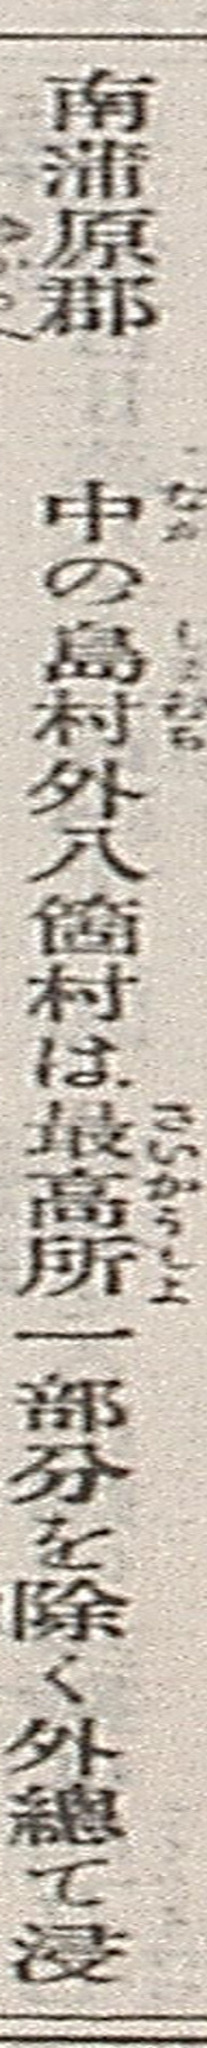南蒲原郡中の島村外八ヶ村は最高所一部分を除く外総て浸
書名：風俗畫報臨時増刊第百二十八號　洪水被害録（下）
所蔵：東京大学地震研究所図書室 Earthquake Research Institute Library, The University of Tokyo, JAPAN
